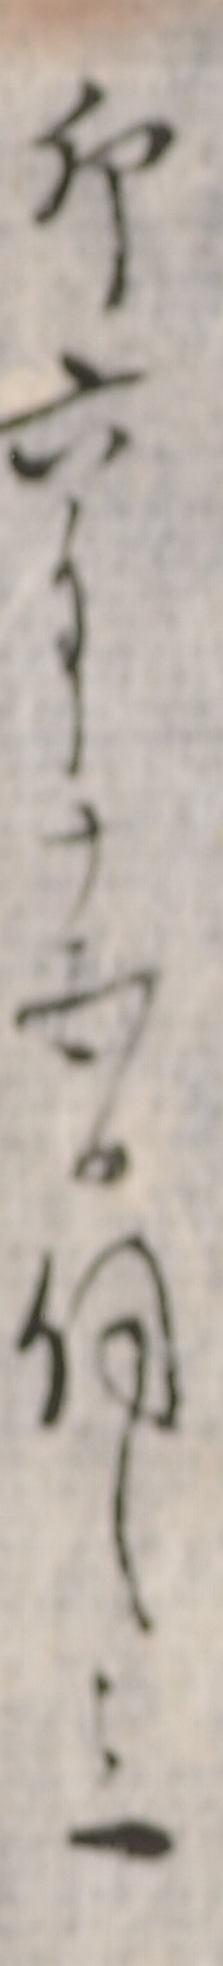卯六月十五日伺之上
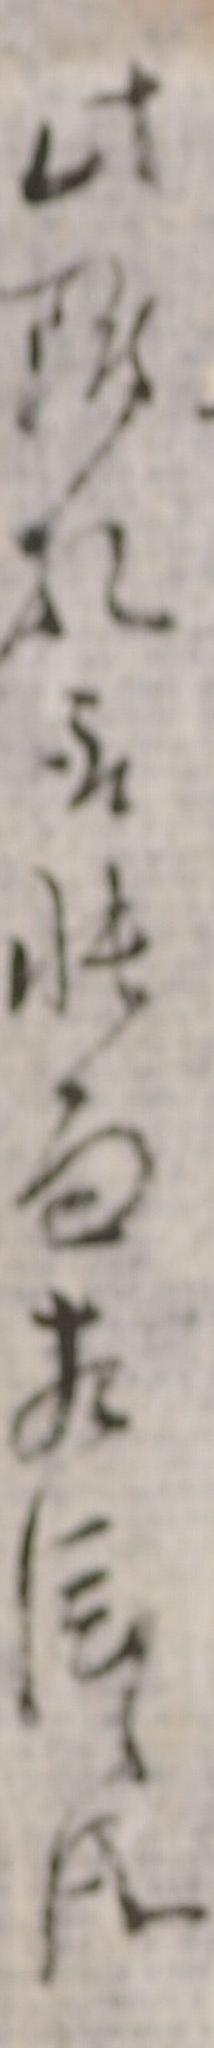此附札取帳面相渡候様
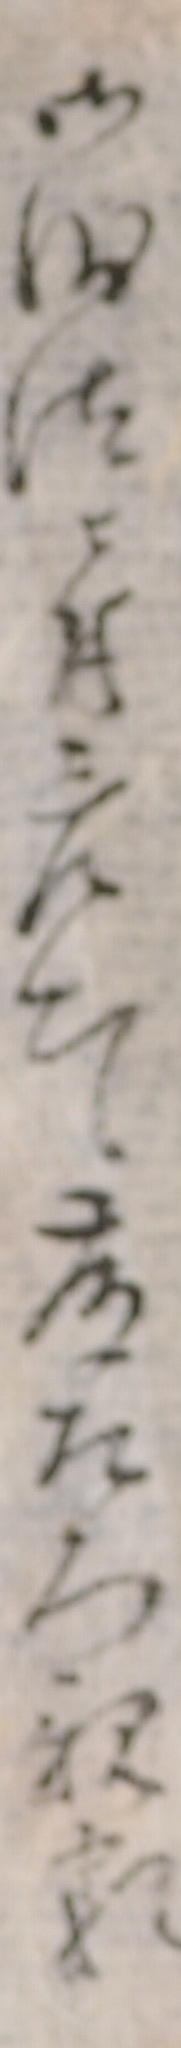御沙汰ニ付差出候藤左衛門親類
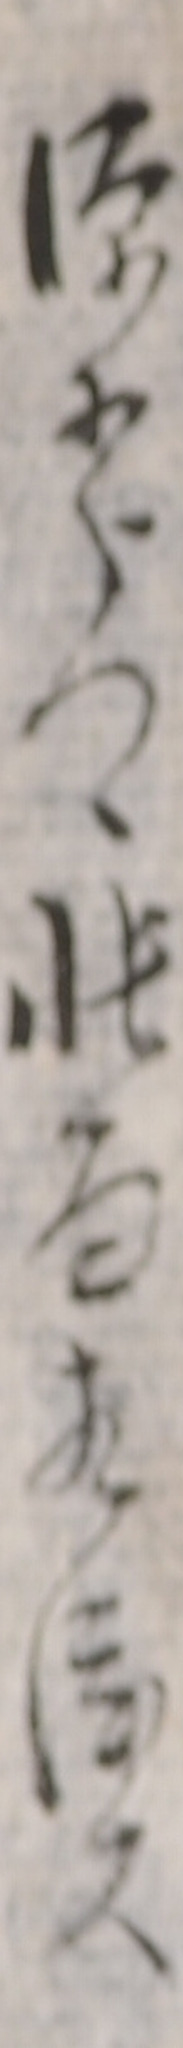源五郎左衛門へ相渡ス

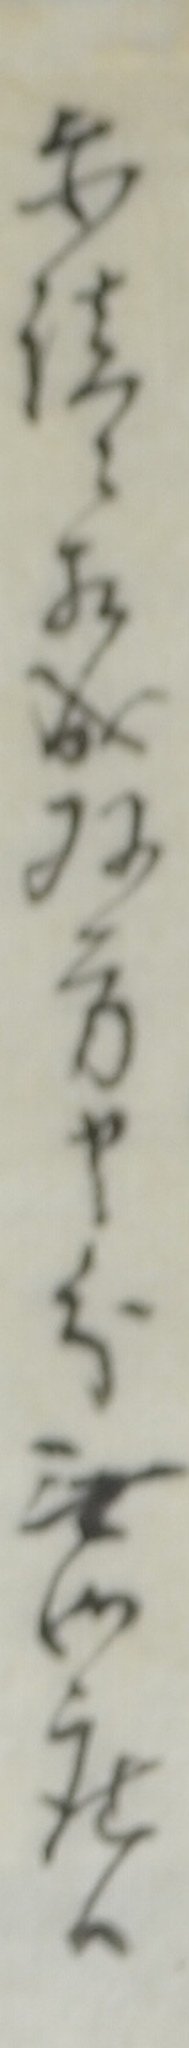ヲに亦請ニ相成双方申分無御座候
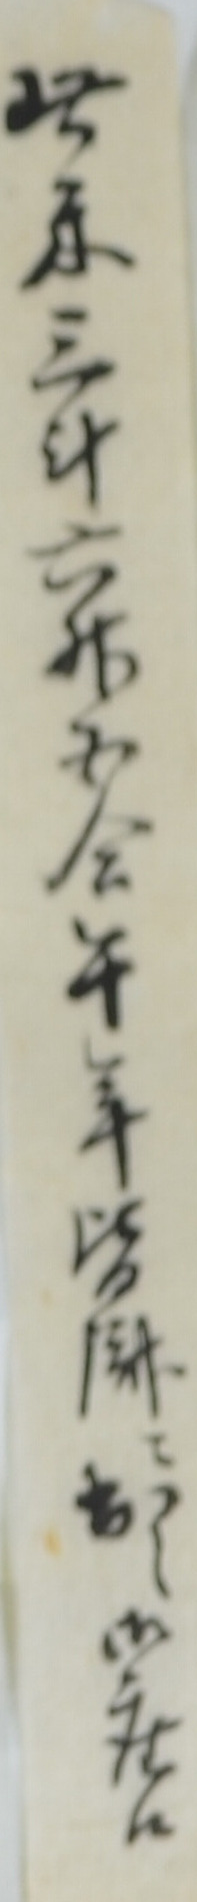リろ此米三斗六升五合午年皆済ニ出し御座候
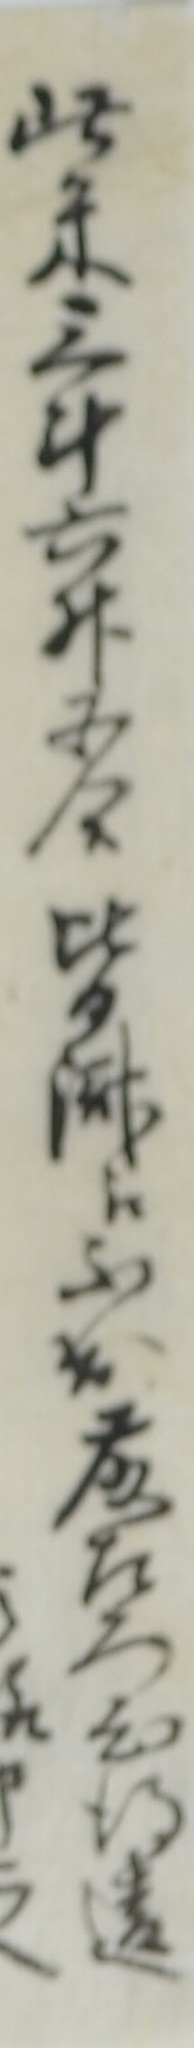トトノロ此米三斗六升五合皆済江不出藤左衛門心得違
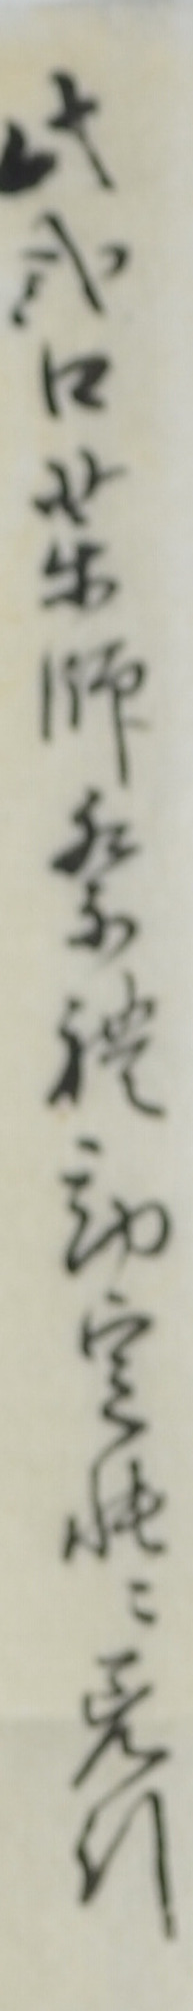此弐口薬師祭礼勘定帳に差引
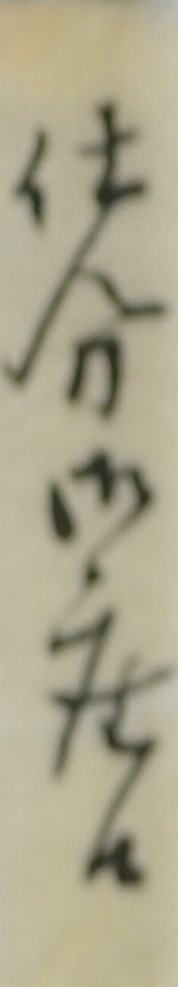仕分御座候
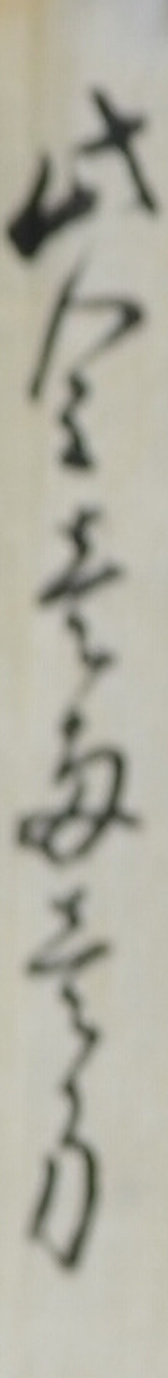此金壱両壱分
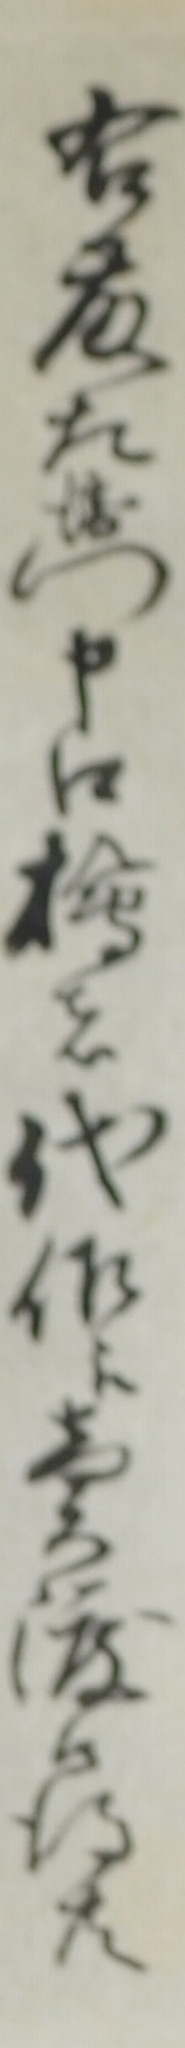右藤左衛門申口檜は代作江売渡候得共
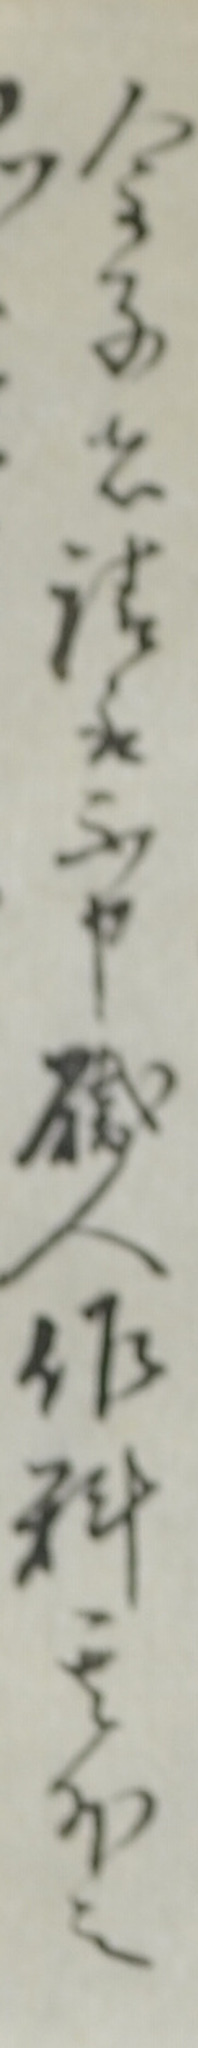金子者請取不申職人作料其外也
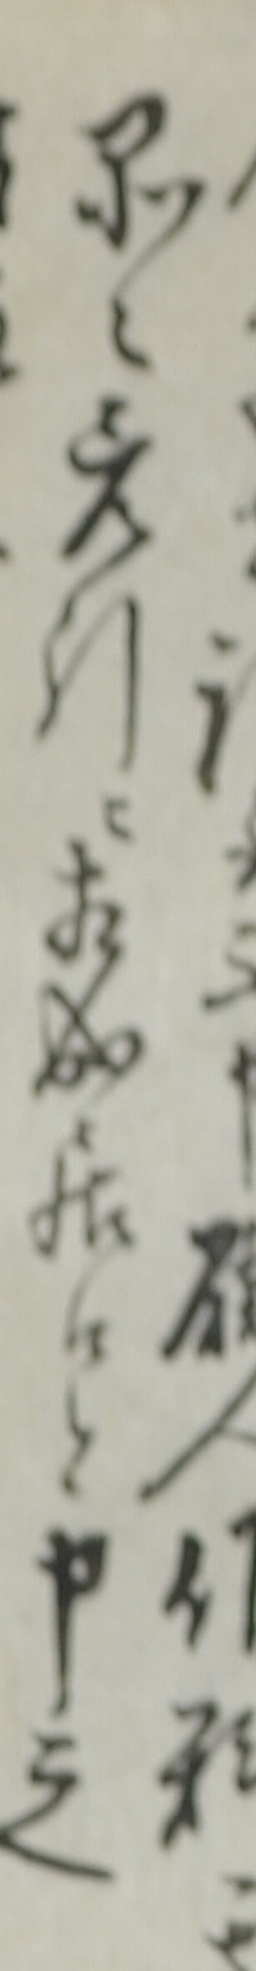品々差引ニ相成居候と申立
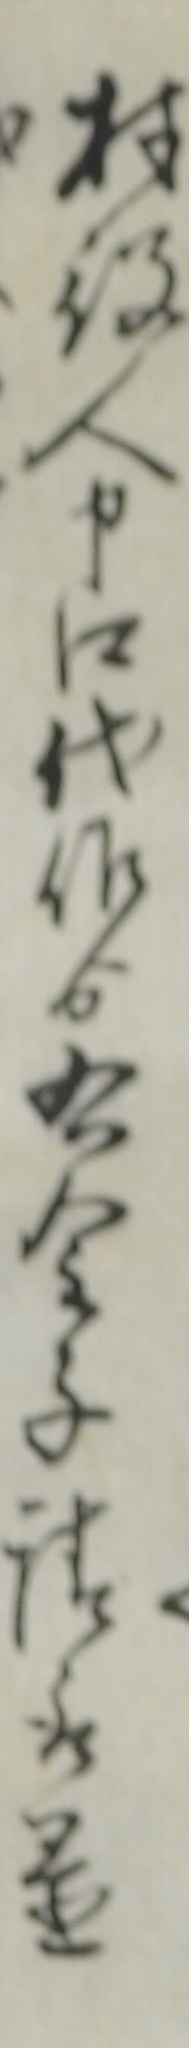村役人申口代佐ゟ右金子請取置
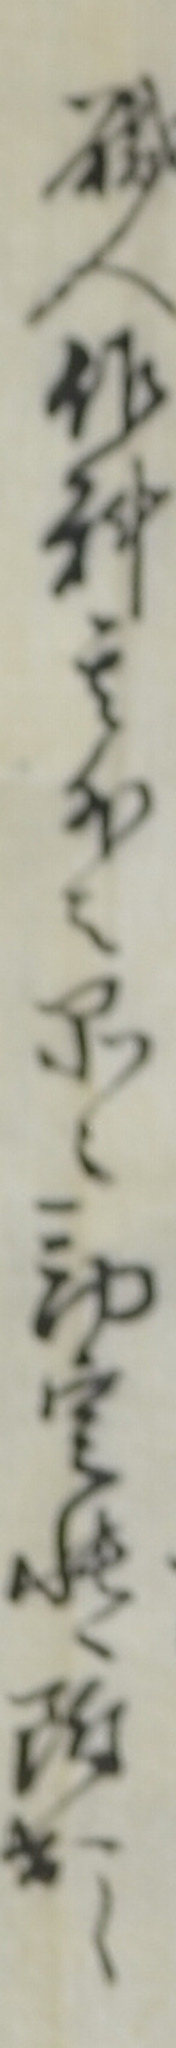職人作料其外之品々勤定帳へ附出し
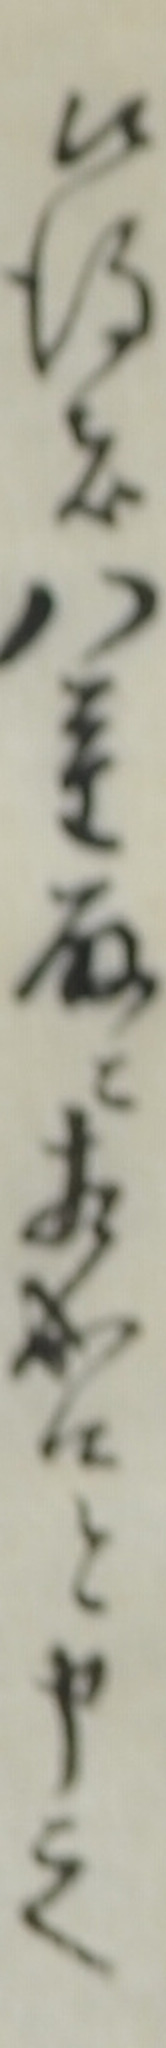候得は八重殿ニ相成候と申之
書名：（付札一括）
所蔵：伊那市立高遠町図書館・合同会社AMANE
